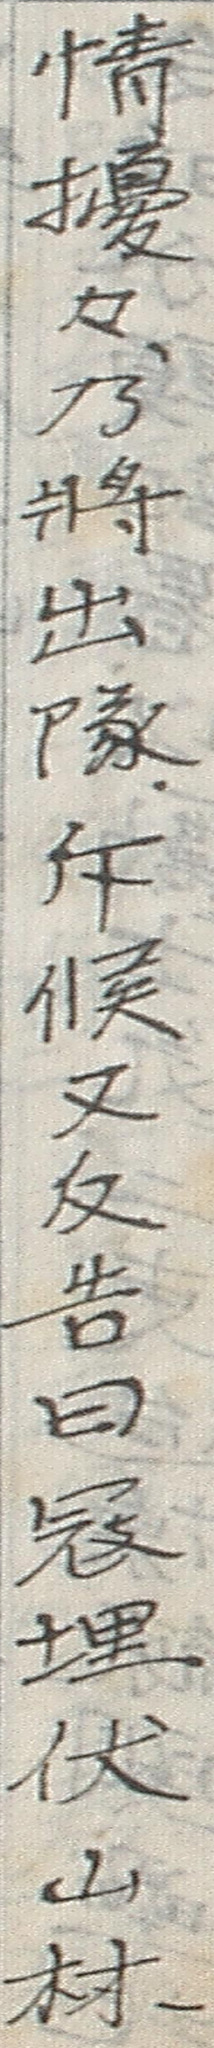情擾々、乃将出隊、斥候又反告曰冦埋伏山林
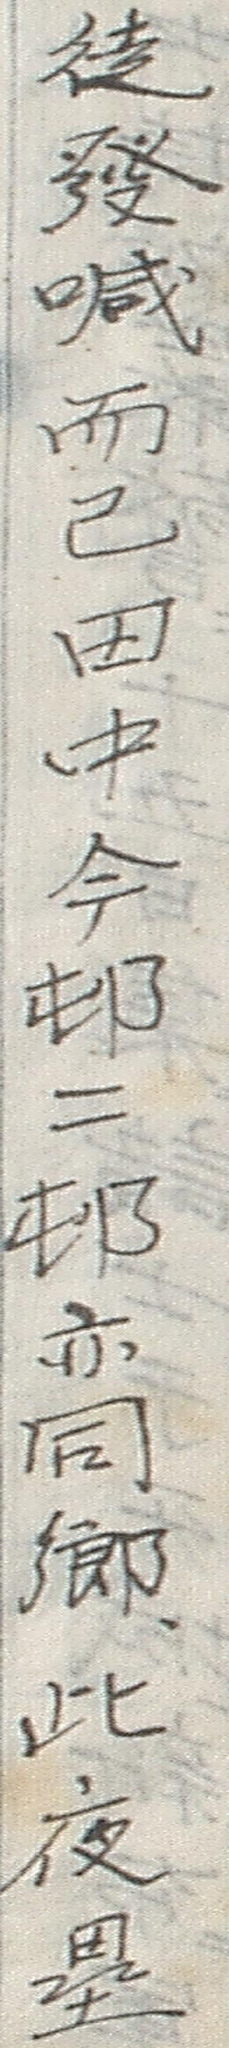徒発喊而己田中今邨二邨亦同郷、此夜塁

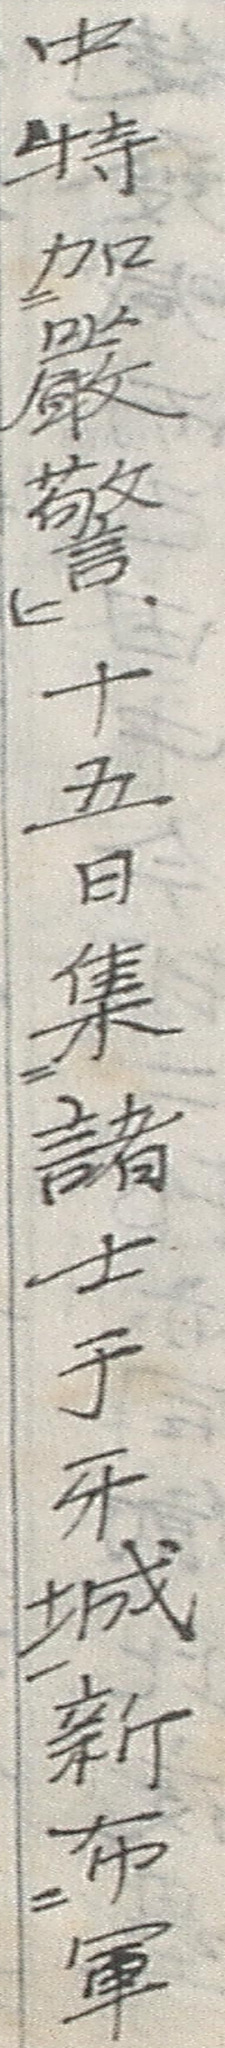中特加厳警ㇾ、十五日集諸士干牙城新布軍
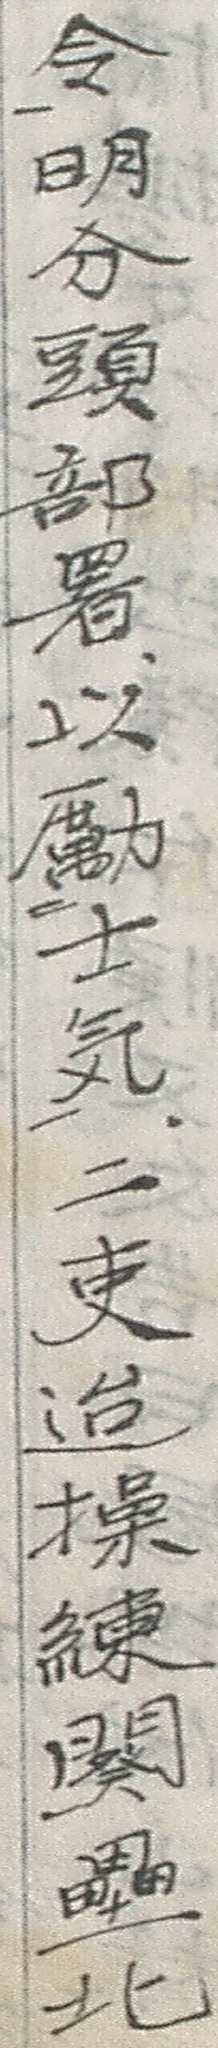令明分頭部署、以励士気、二吏迨操練闋塁北
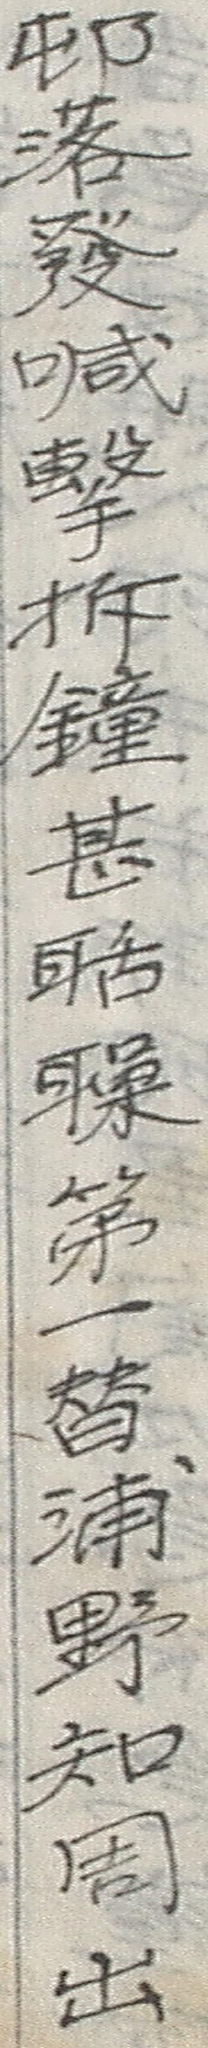邨落発喊撃拆鐘甚聒第一替、浦野知周出
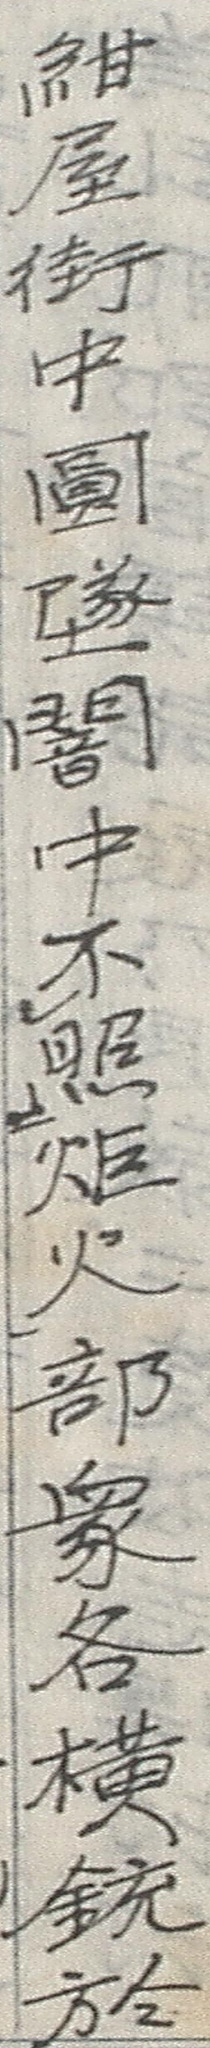紺屋街中圓墜闇中不ㇾ照炬火部衆各横銃於
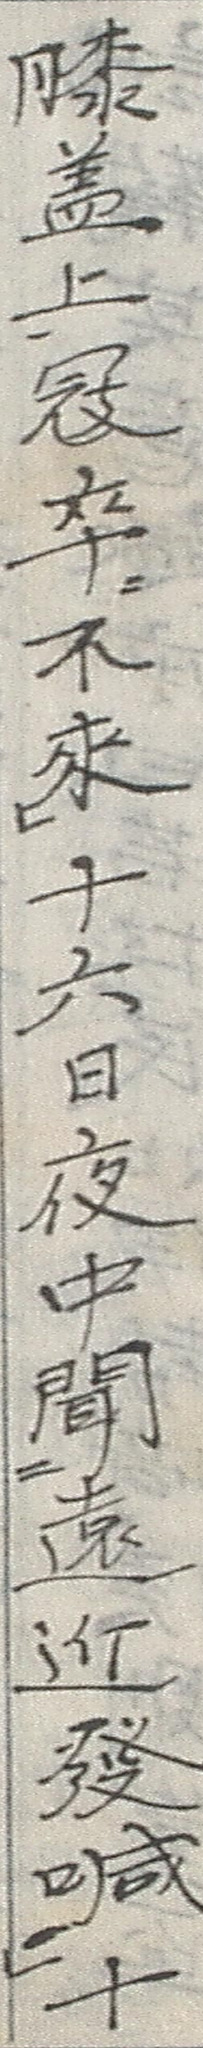膝盖上冦卒不来ㇾ十六日夜中聞遠近発喊十
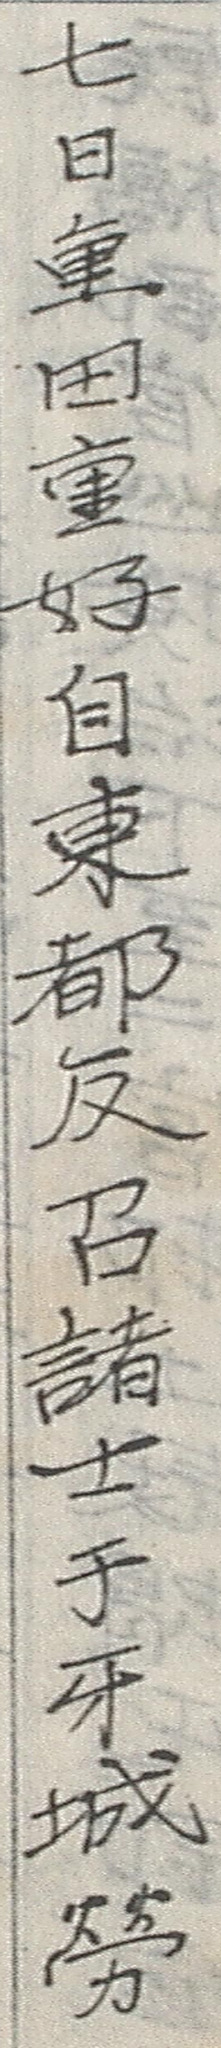七日重田重好自東部反召諸士干廳牙城労
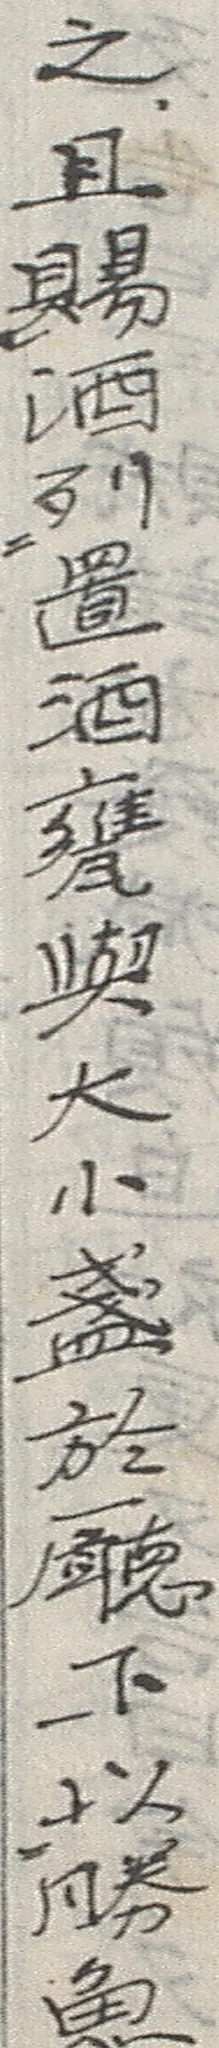之、且賜酒列置甕輿大小盛於廳下以勝魚
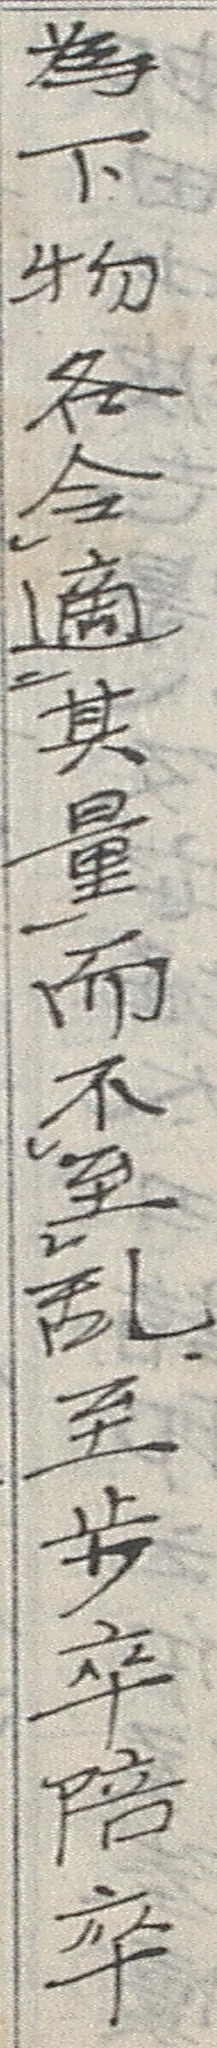為下物各令ㇾ適其量而不ㇾ至ㇾ乱、至歩卒陪卒
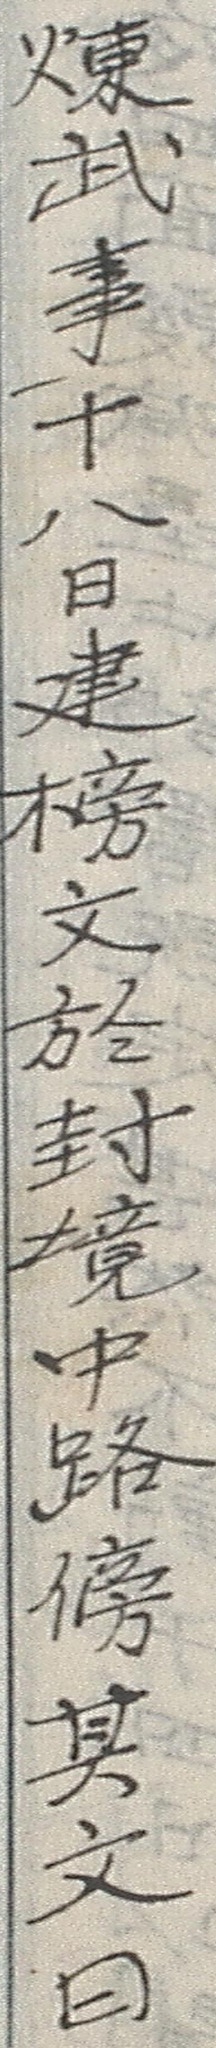煉武事十八日建榜文於封境中路傍其文曰
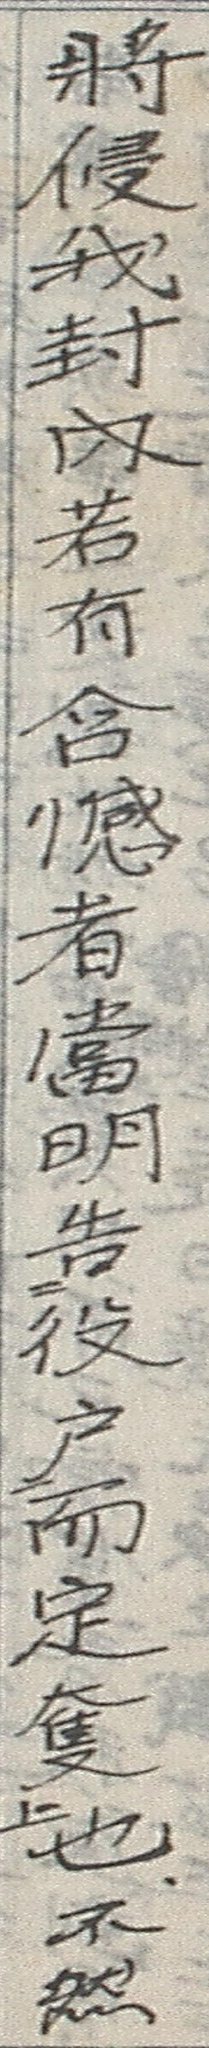将侵我封内若有含憾者当明告役戸而定奪也不然
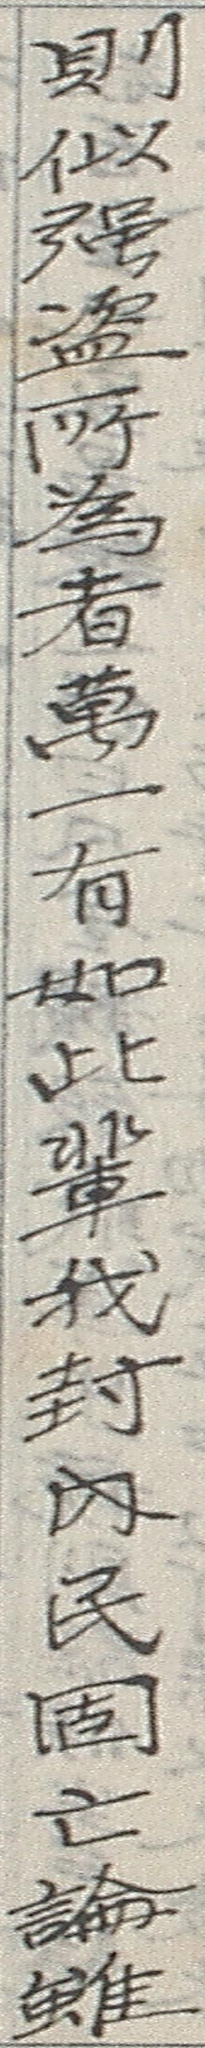則似強盗所為者萬一有如此輩我封内民固亡論雖
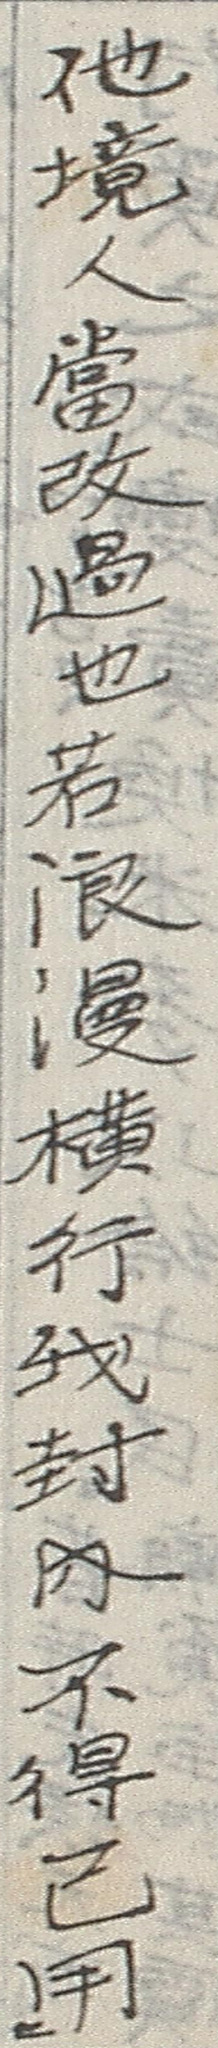他境人当改過也若浪漫横行我封内不得己用
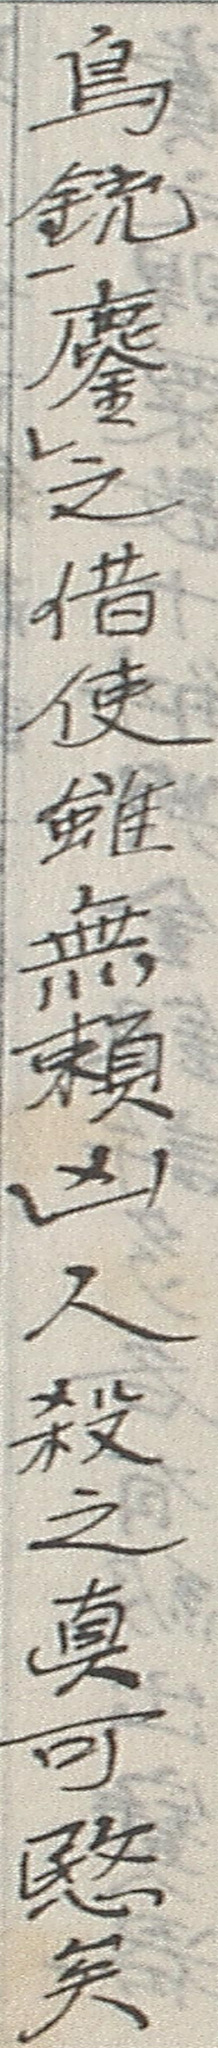鳥銃鏖ㇾ之借使雖無頼凶人殺之真可愍矣
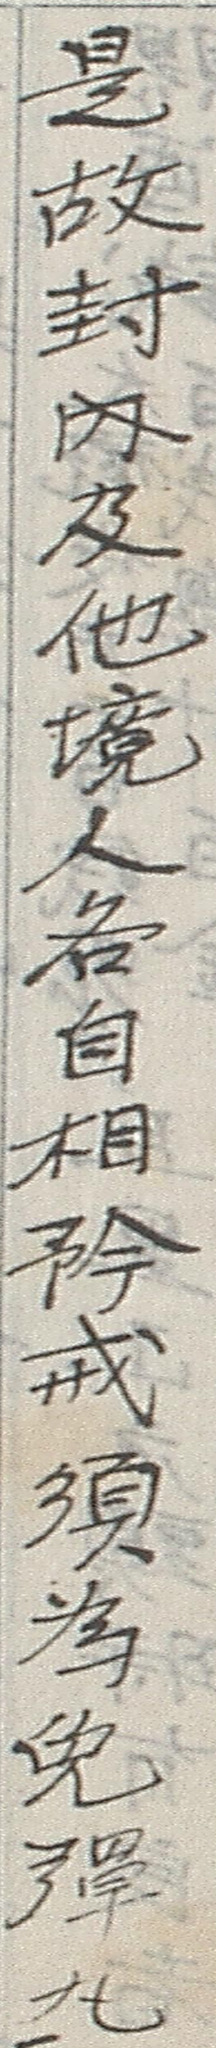是故封内及他境人各相矜戒須為免弾丸
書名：天明三年癸卯六月　沙降記　［蕗原拾続巻之五十二］
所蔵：東京大学地震研究所図書室 Earthquake Research Institute Library, The University of Tokyo, JAPAN
